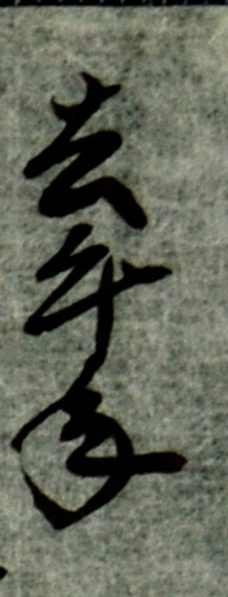去午年
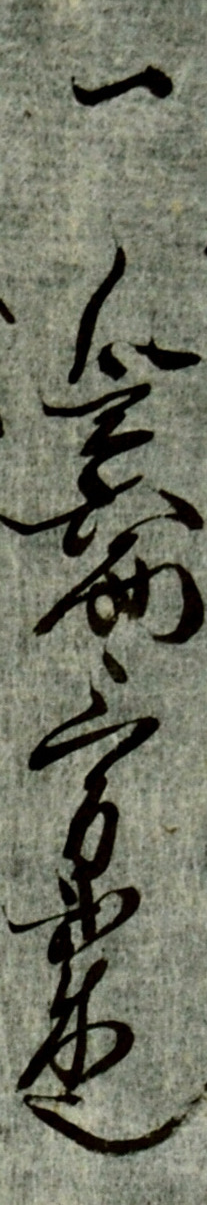一金六両三分弍朱也
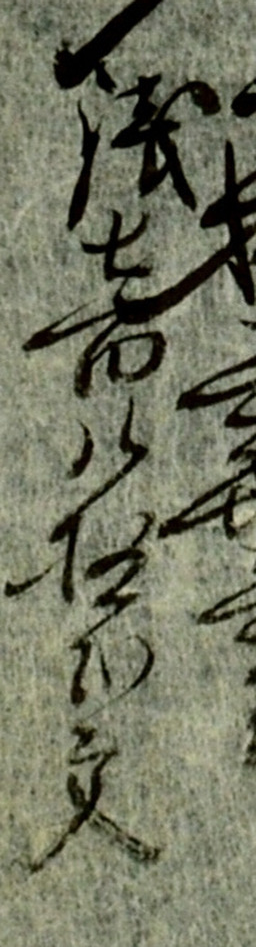銭七百八拾弍文
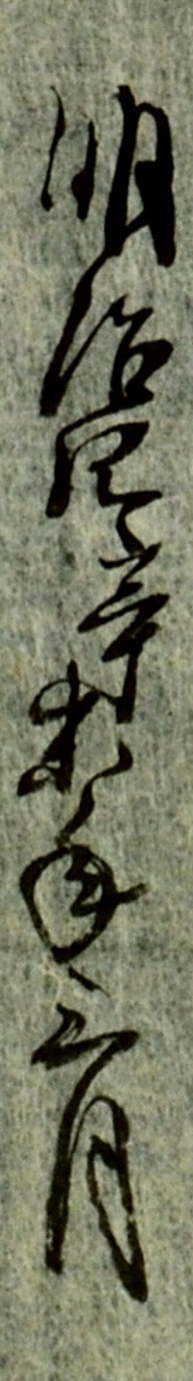明治四辛未年三月
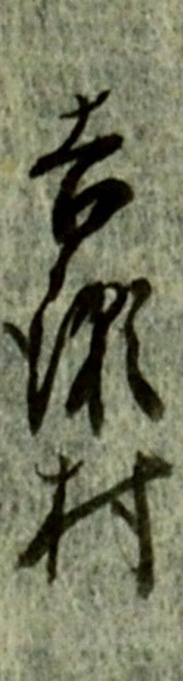吉瀬村
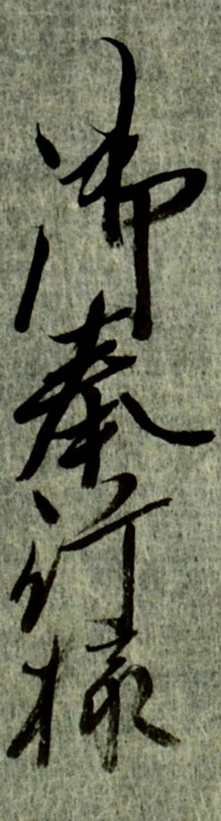御奉行様
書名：乍恐以書付奉願上候御事
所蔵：伊那市立高遠町図書館・合同会社AMANE
